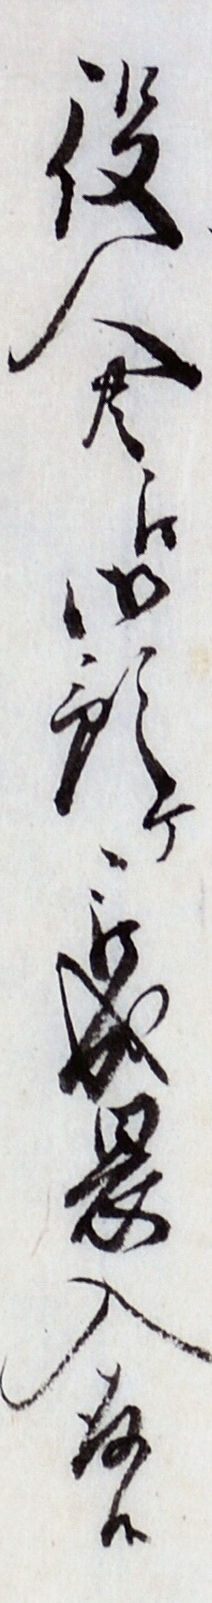役人共え御預ヶ被成畏入存候
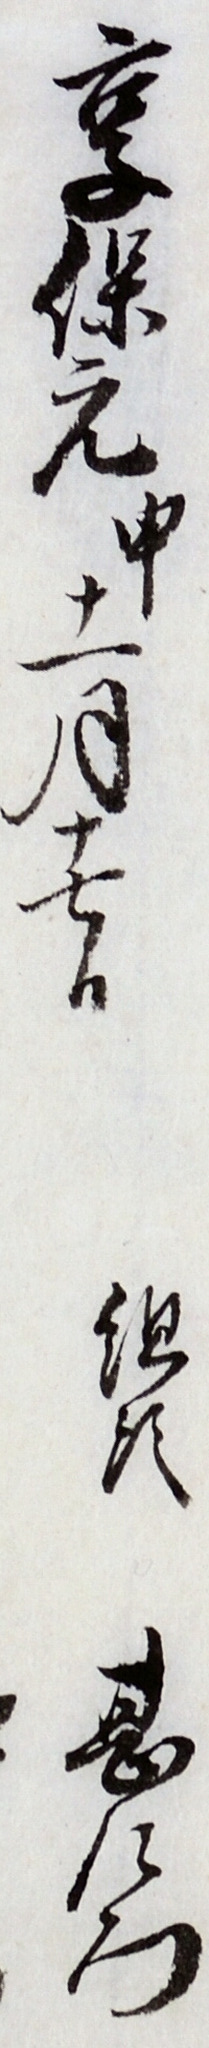享保元申十一月十七日同同孫右衛門
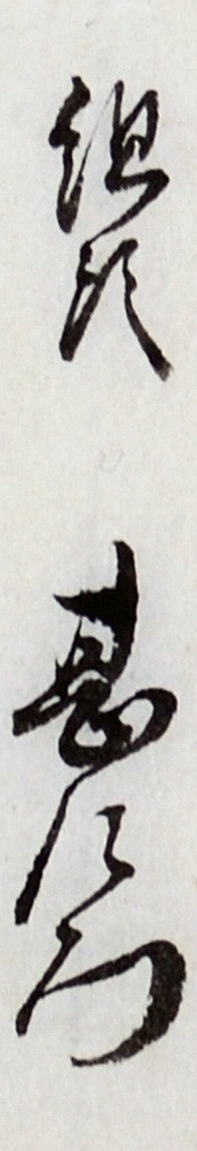組頭甚左衛門
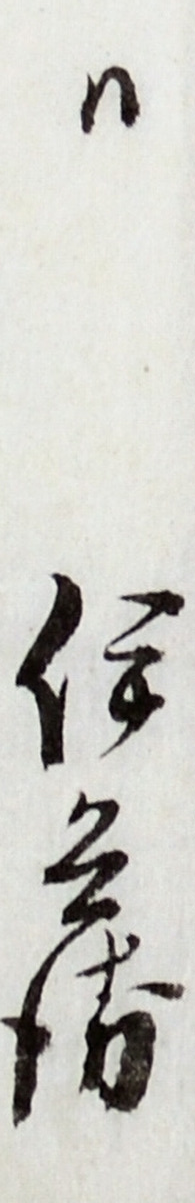同伊兵衛
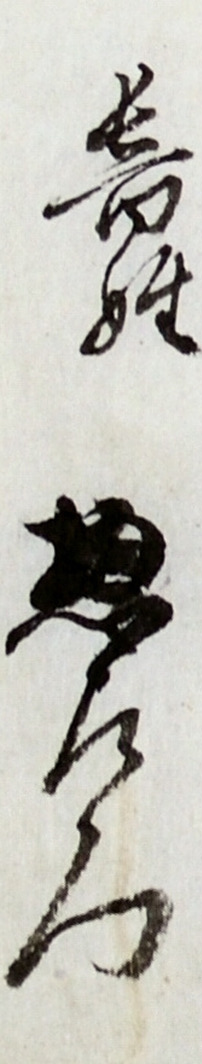長百姓惣左衛門
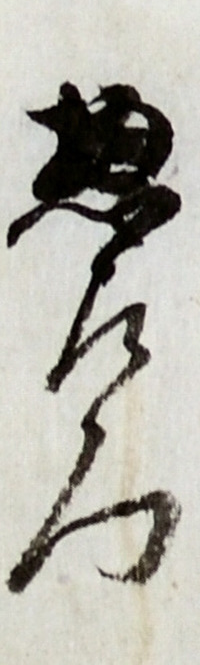所左衛門

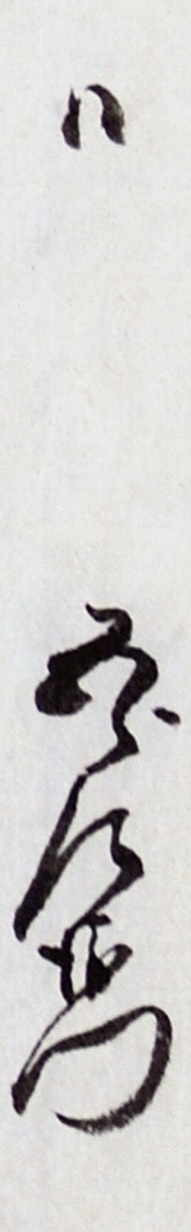同五郎左衛門
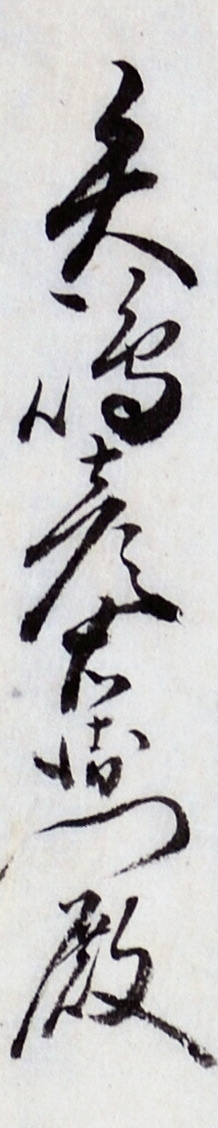矢嶋彦右衛門殿
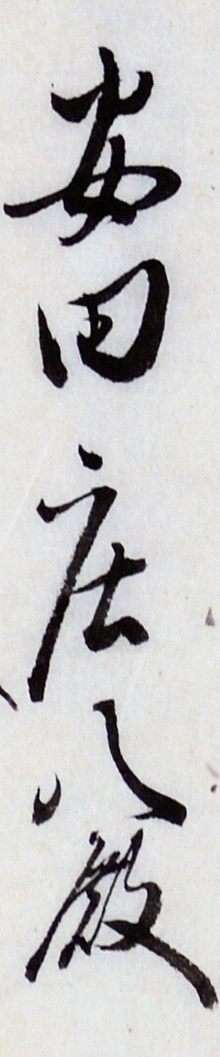安田庄八殿
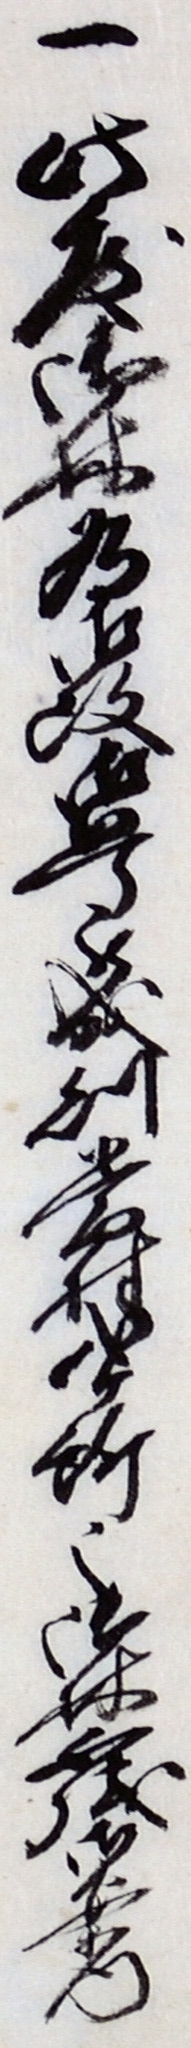一此度御林為御改付廻り被成則当村弐ヶ所之御林不残御案内
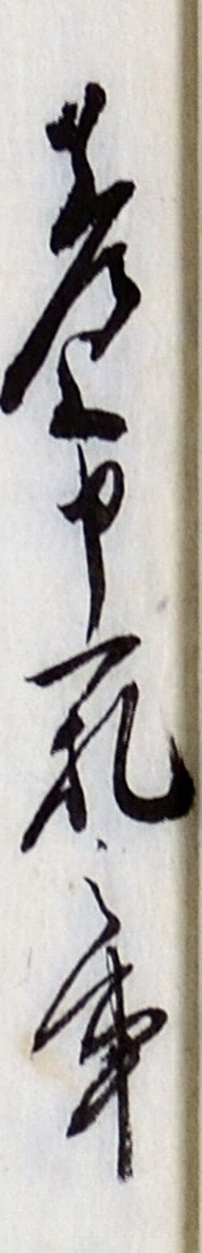差上申一札之事
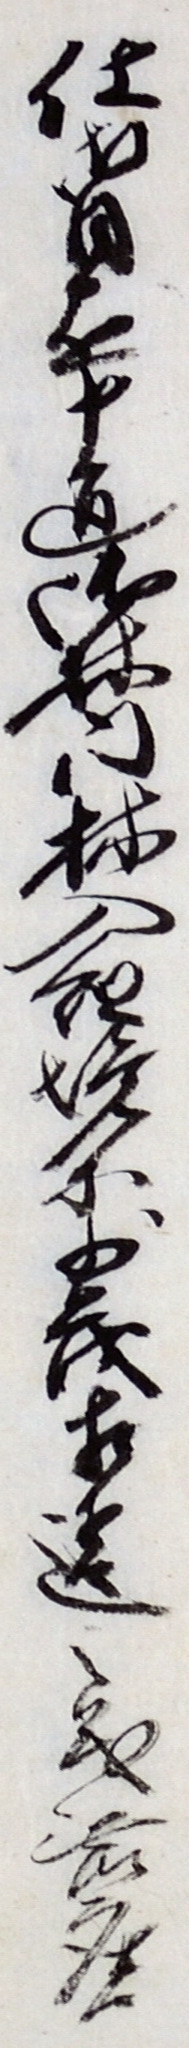仕御目懸申通御林内林入組境等少も相違之義無御座候
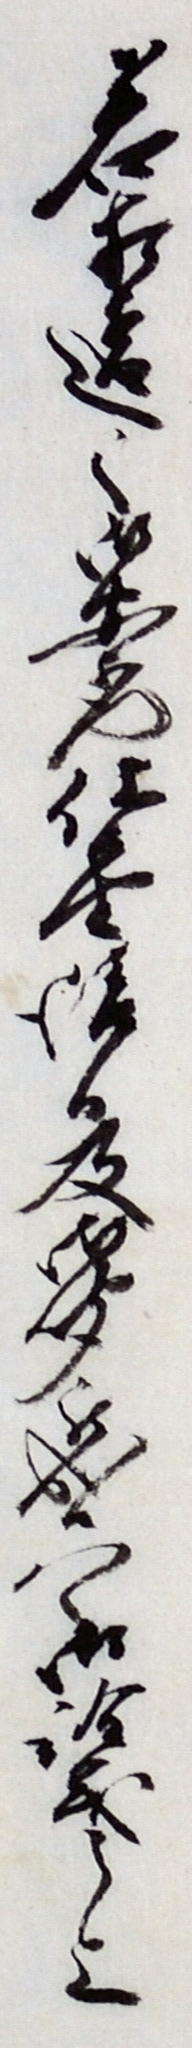若相違之御案内仕候由後日及御聞被成候ハヽ御詮義之上
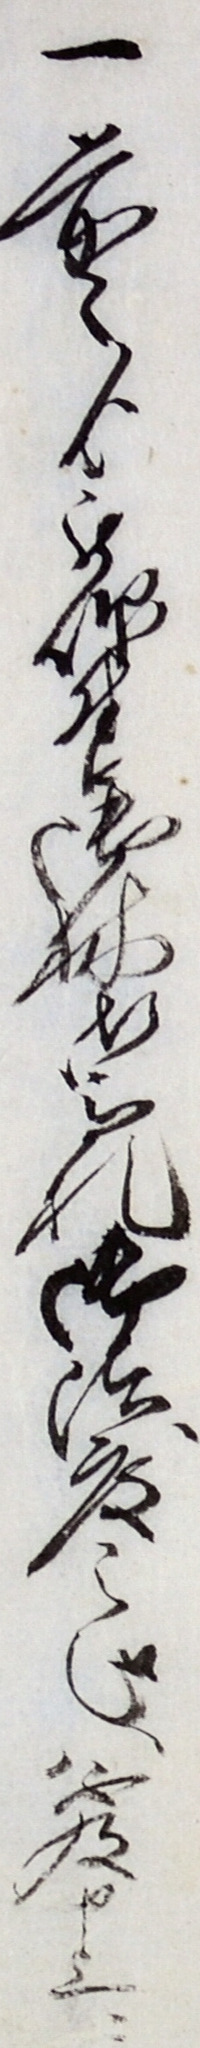一前々ゟ被仰付候御林御高札御法度之趣ハ不及申上ニ
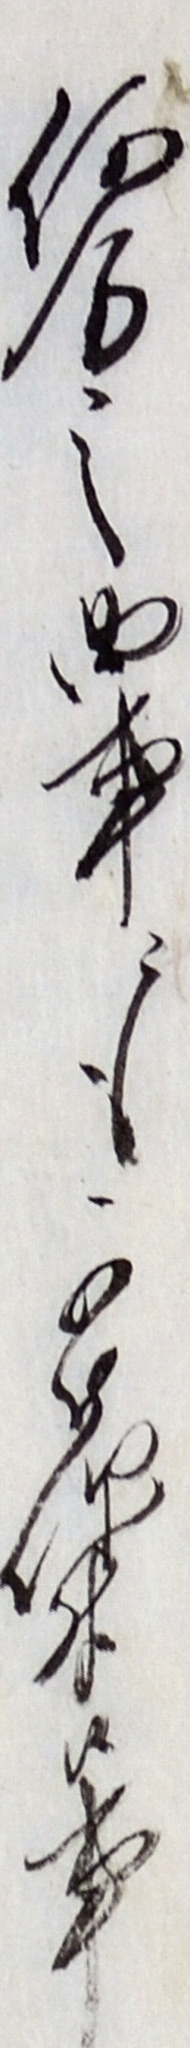何分之曲事ニも可被仰付候事
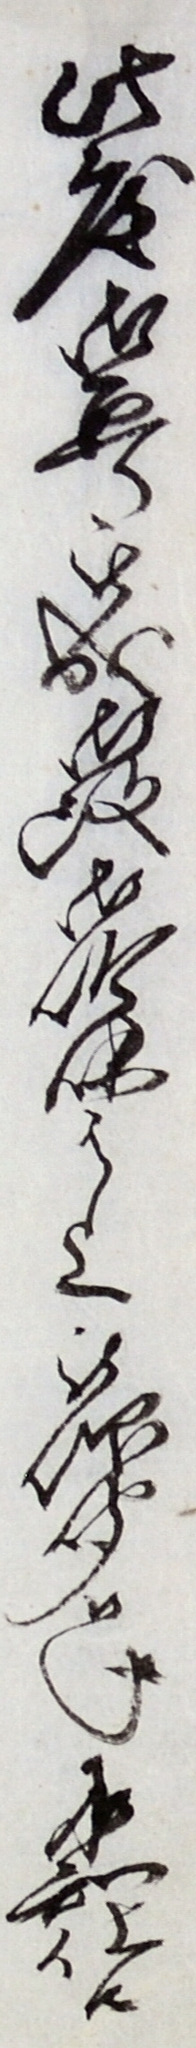此度御廻り被成御改御吟味之上被仰聞候趣承知仕候
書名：御林御竹藪証文控
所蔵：伊那市立高遠町図書館・合同会社AMANE
